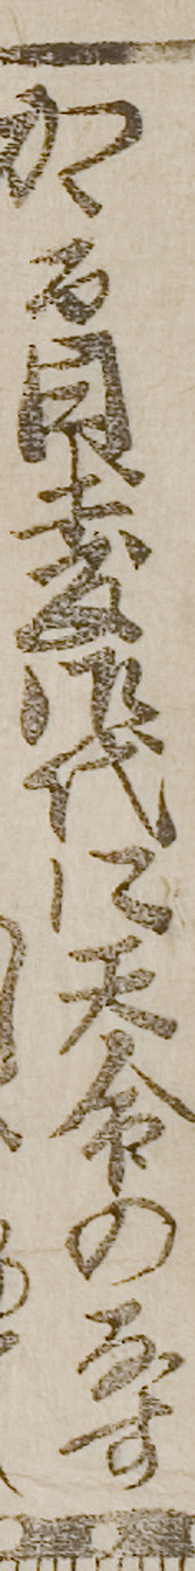かゝる目出度御代に天命のなす
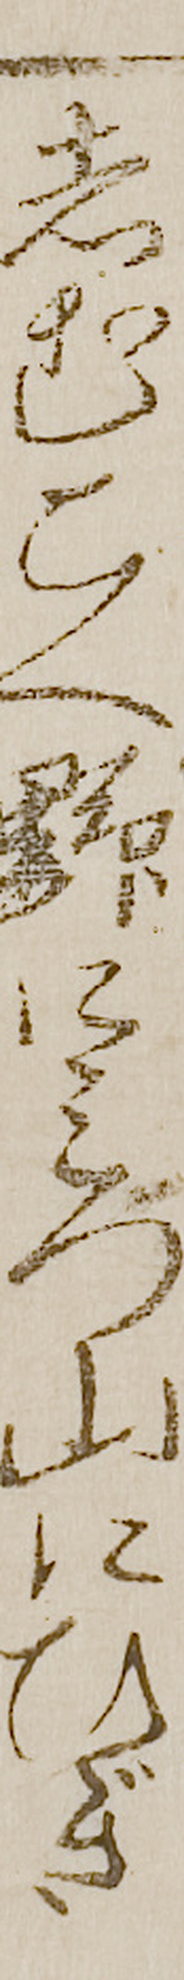しむこへ野にみつ山にひゞき
